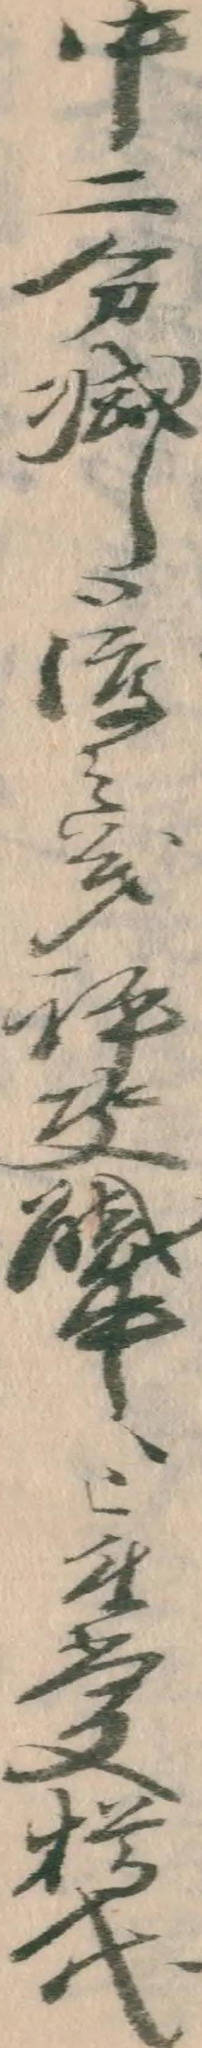中二分減し御渡之義評決職中へ被付尚又樽代
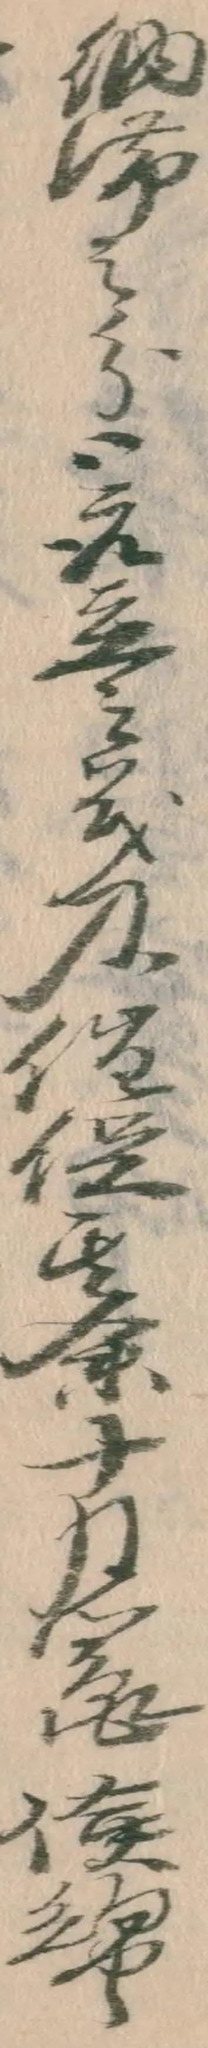納滞之分御取立之義及催促其余十月鬮倹約
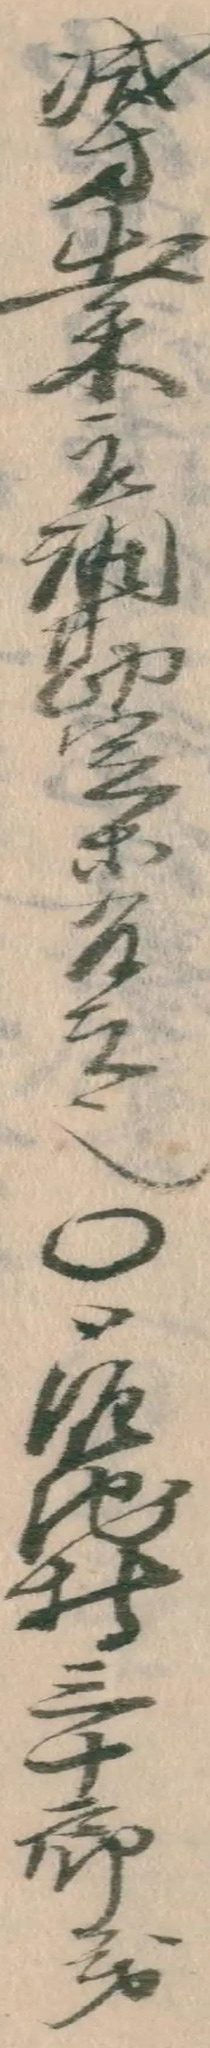減方出来取調勘定等有之也○御泥池村三十郎義
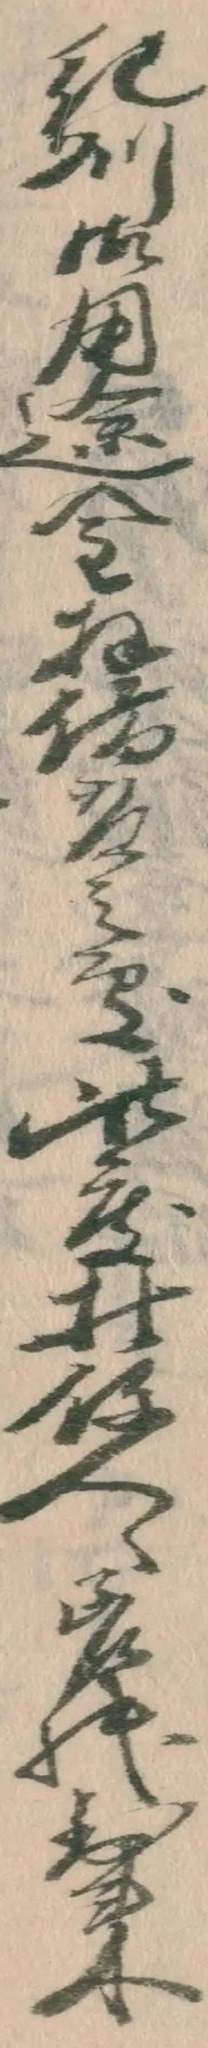紀州御用途金拝借有之處此度村役人へ差押到来
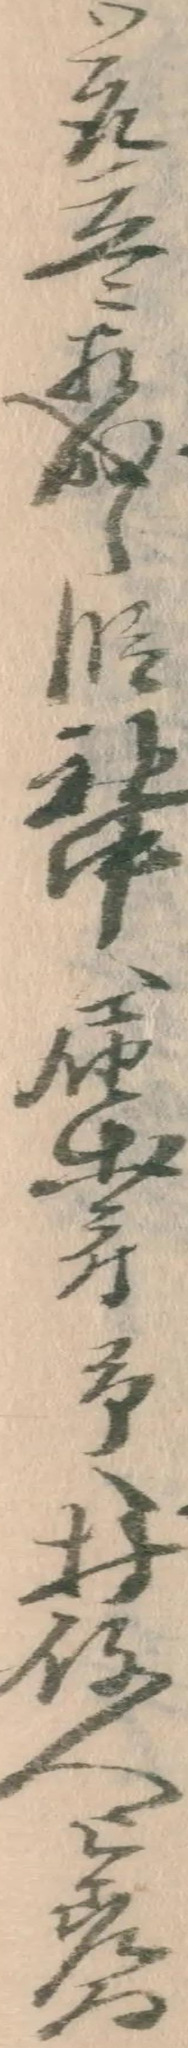御取立二相成候段社中へ届出ニ付予ヘ村役人被差向
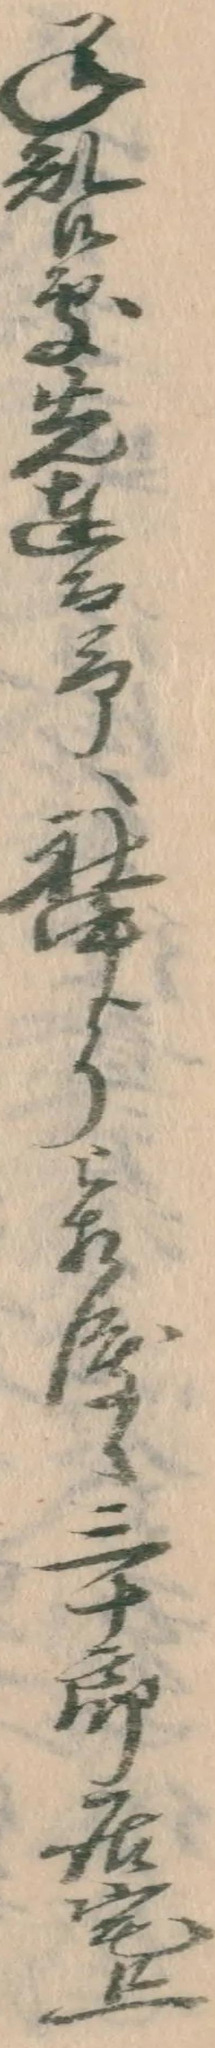承知候處先達而予へ社中より被相渡候三十郎居宅迄
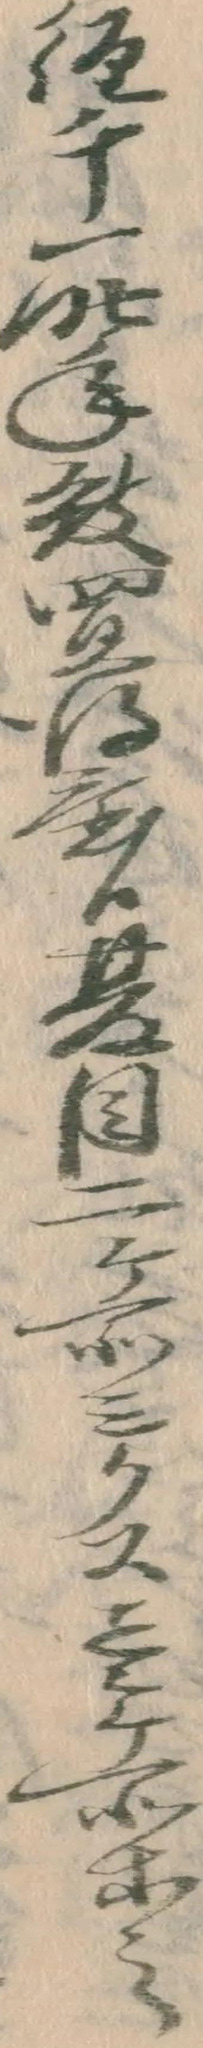経千一昨年致買得置候夏目二ヶ所ミクス壱ヶ所等之
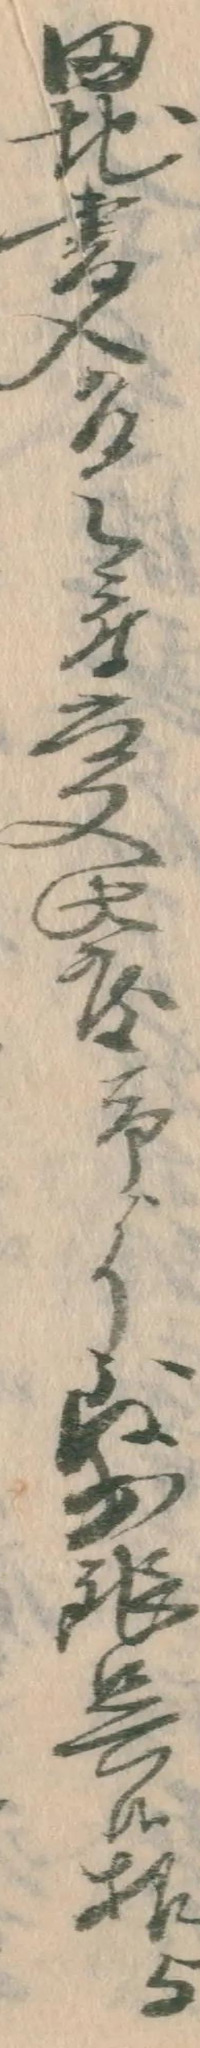田地書入有之ニ付尚又此度予より致出銀呉候様と
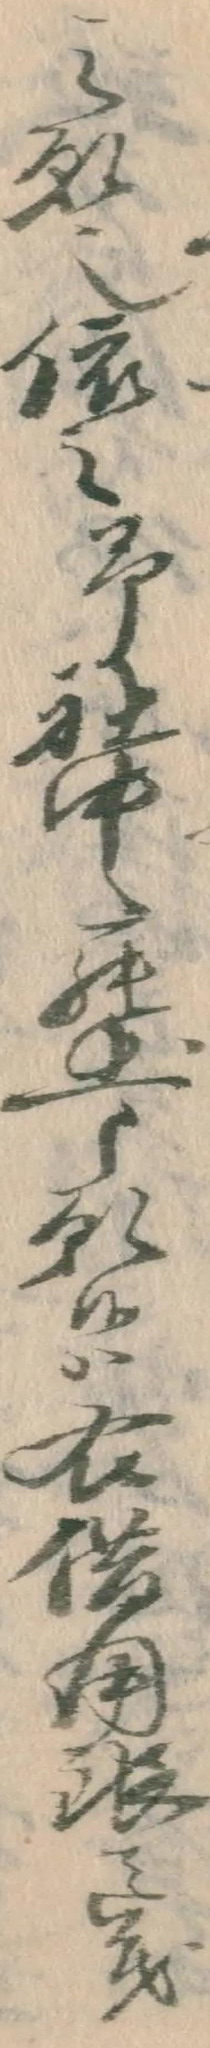之願也依之予社中へ罷出申願候ハ右借用銀之義
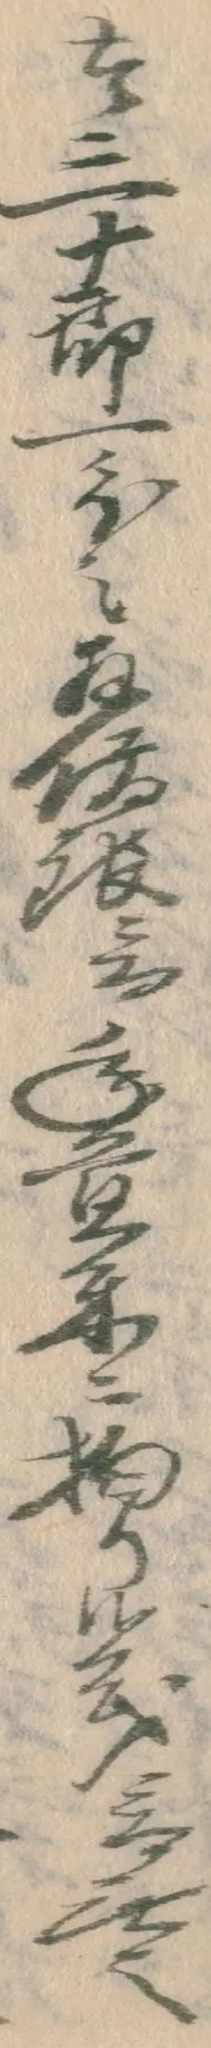は三十郎一分之拝借銀ニ而年貢米に拘り候義ニ而無之
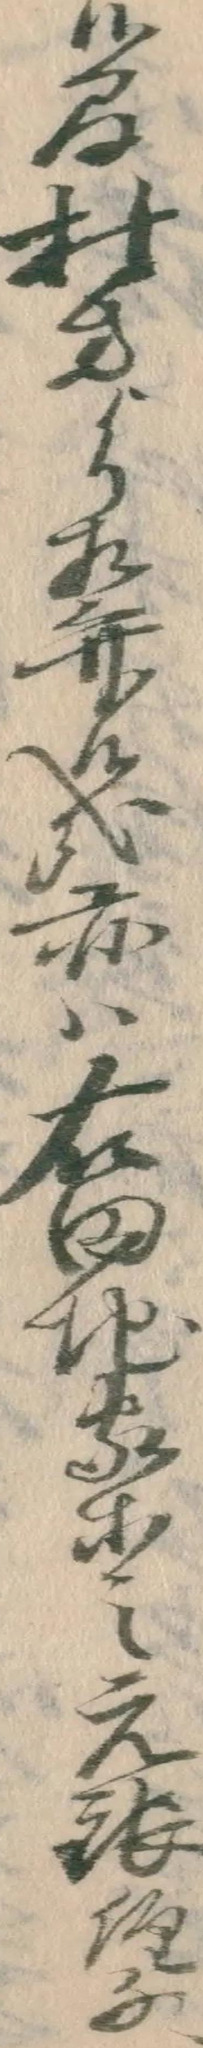候間村方より相弁候哉亦ハ右田地家等之元銀経水
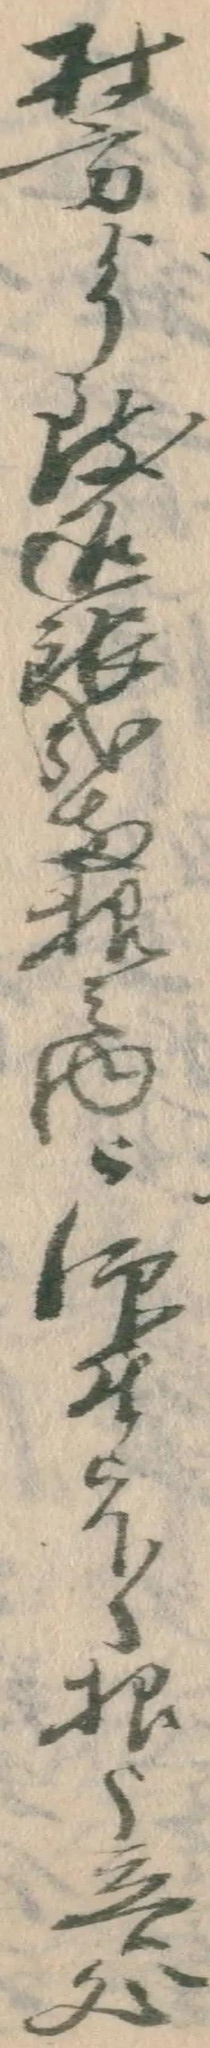村方より致退銀弐両様之内被仰付被下候様申立候処
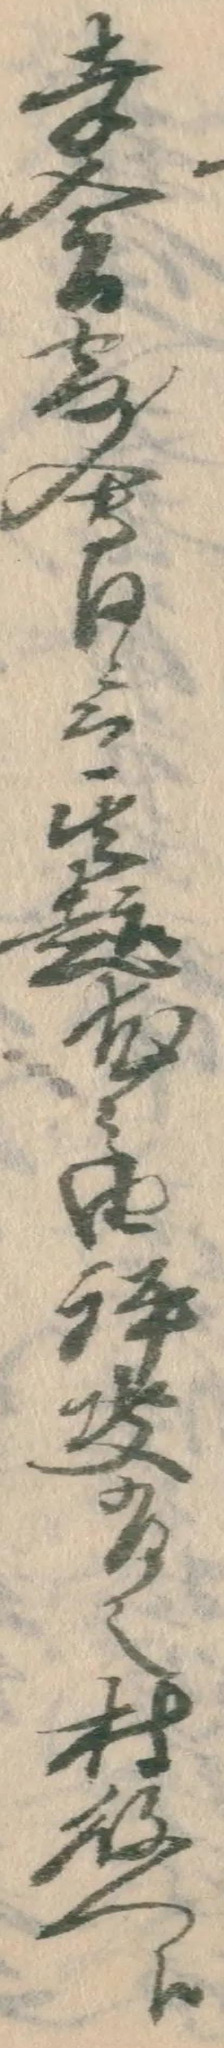寺今日寄會日二而其趣尤之由評決有之村役人江
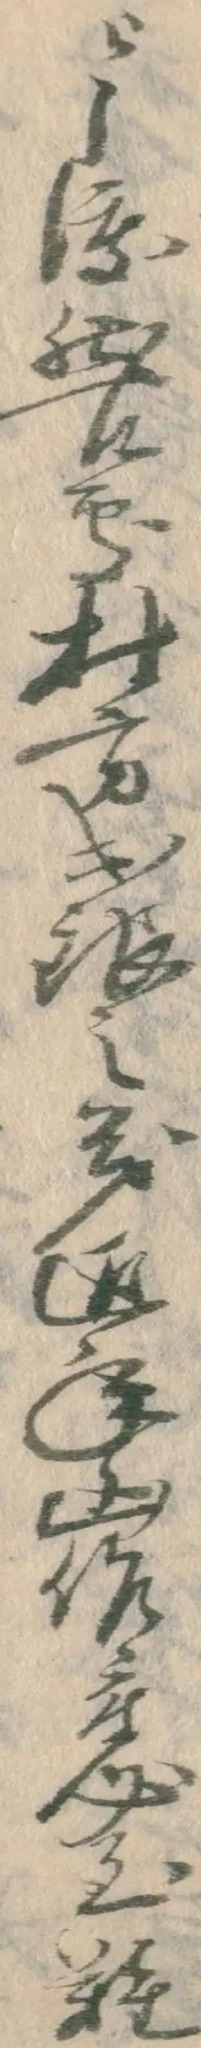被申渡然ル處村方出銀之義近年凶作ニ付必至難
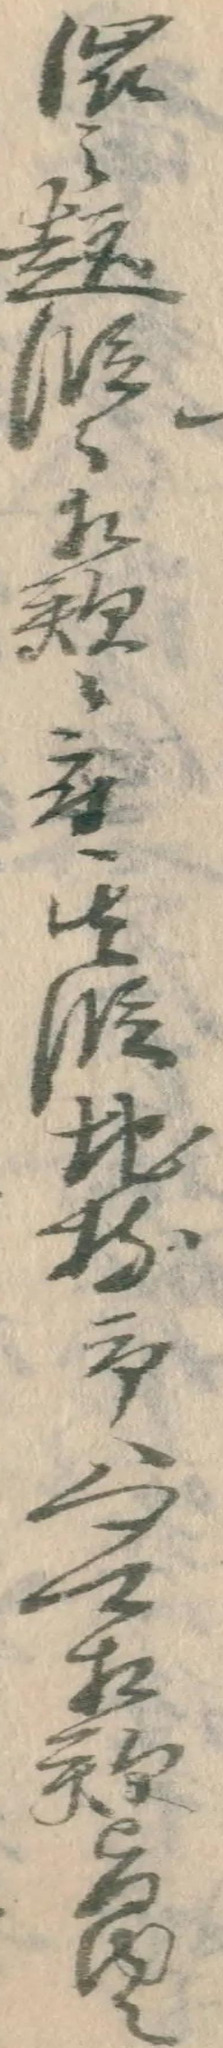渋之趣段々相歎候ニ付其段地持予へ向可相歎約旨内々
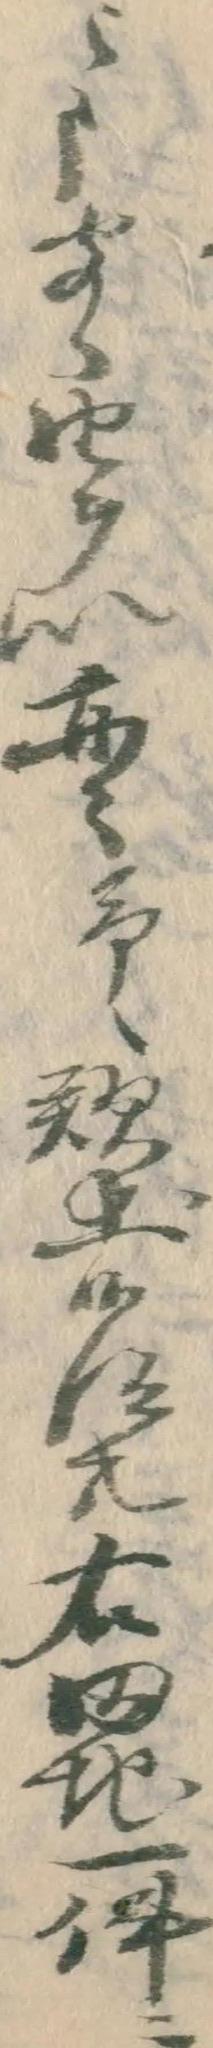被申聞候由ヲ以亦々市へ歎出候得共右田地一件ニ
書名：賀茂社記録. 第67冊
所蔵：国立国会図書館 National Diet Library, JAPAN
